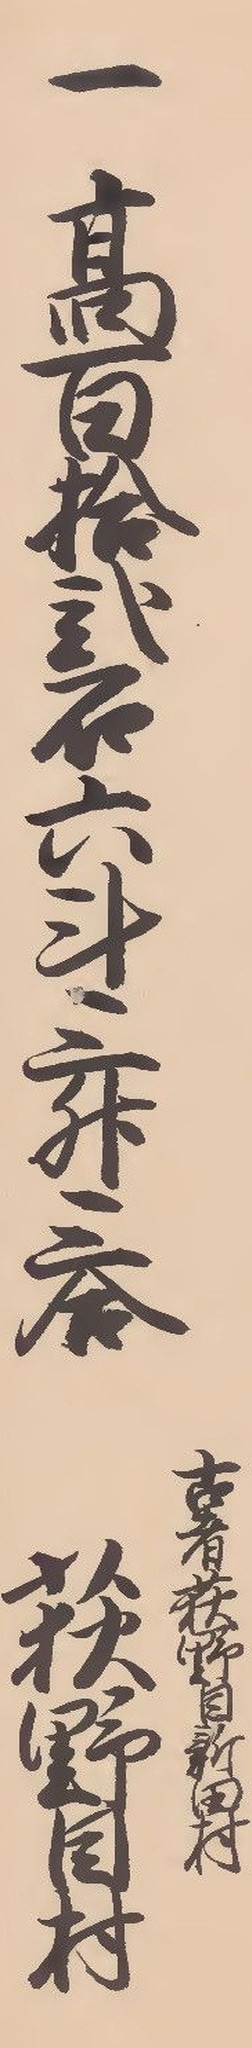一高百拾弐石六斗三升三合萩野目村
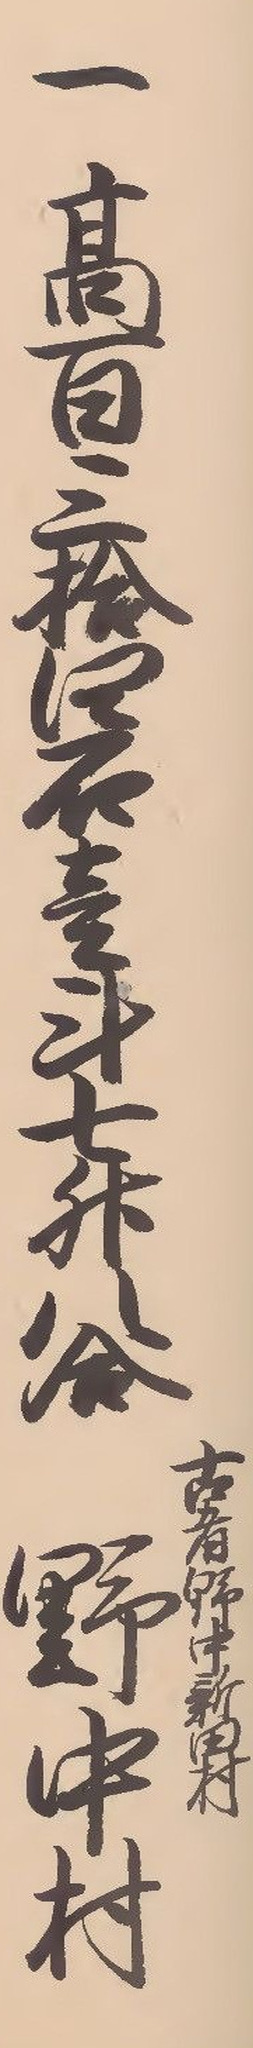一高百三拾四石壱斗七升八合野中村
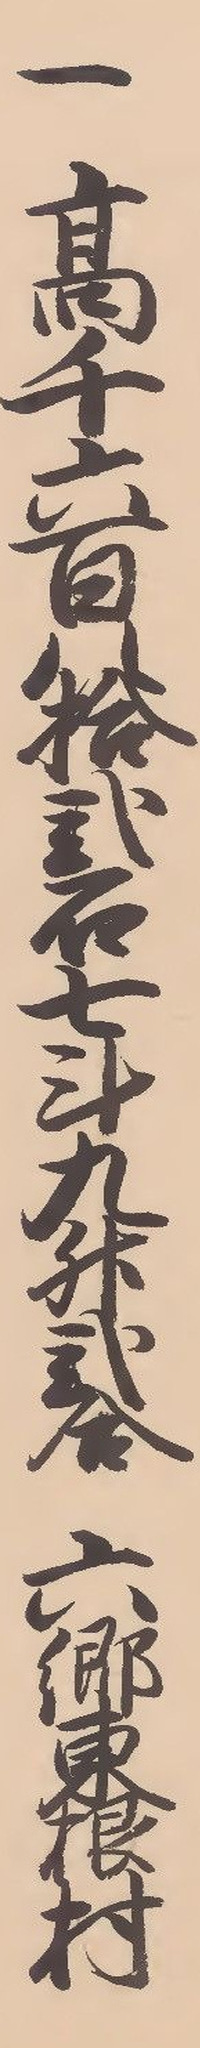一高千六百八拾弐石七斗九升弐合六郷東根村
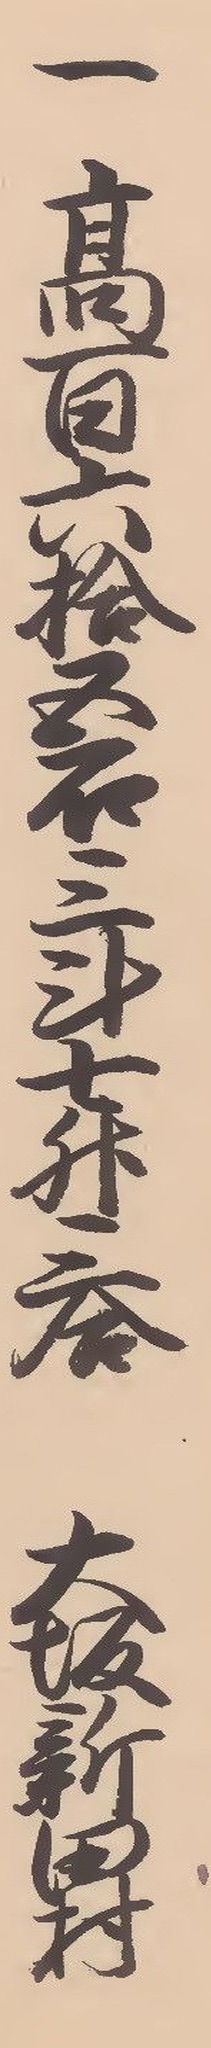一高百六拾五石三斗七升三合大坂新田村
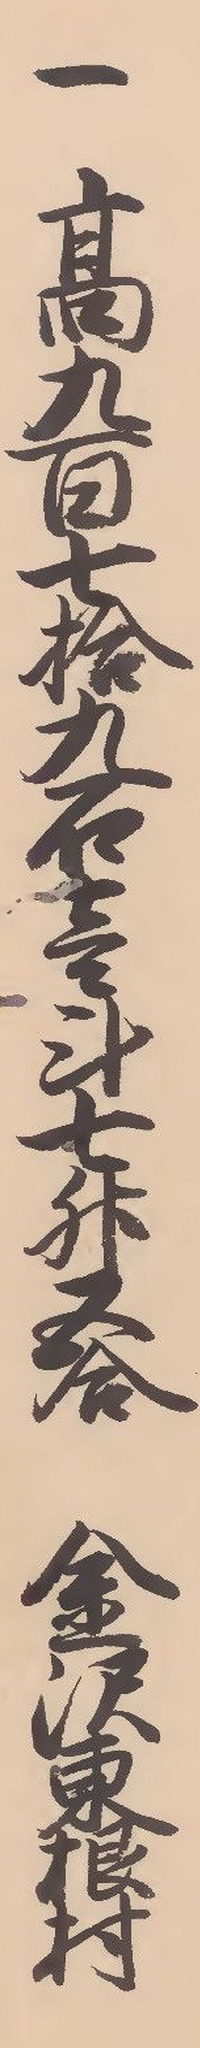一高九百七拾九石壱斗七升五合金沢東根村

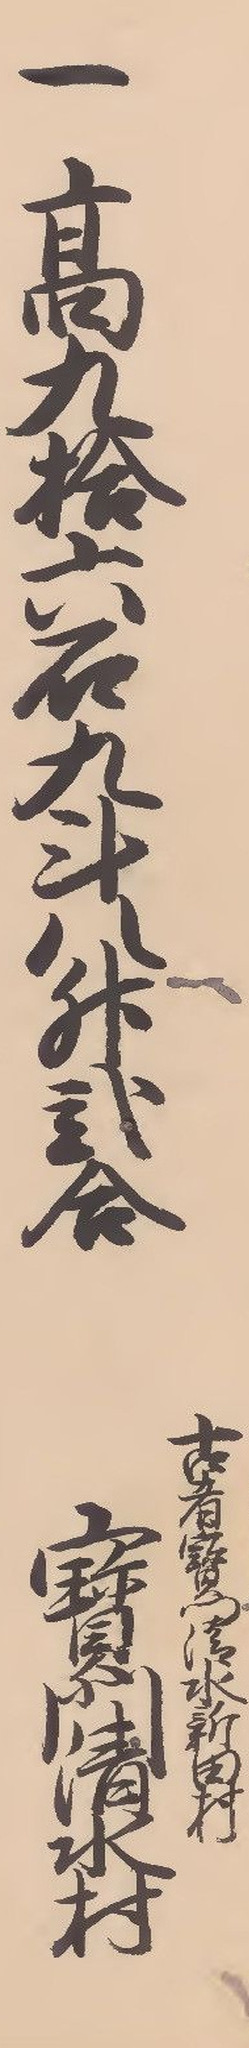一高九拾六石九斗八升弐合宝門清水村
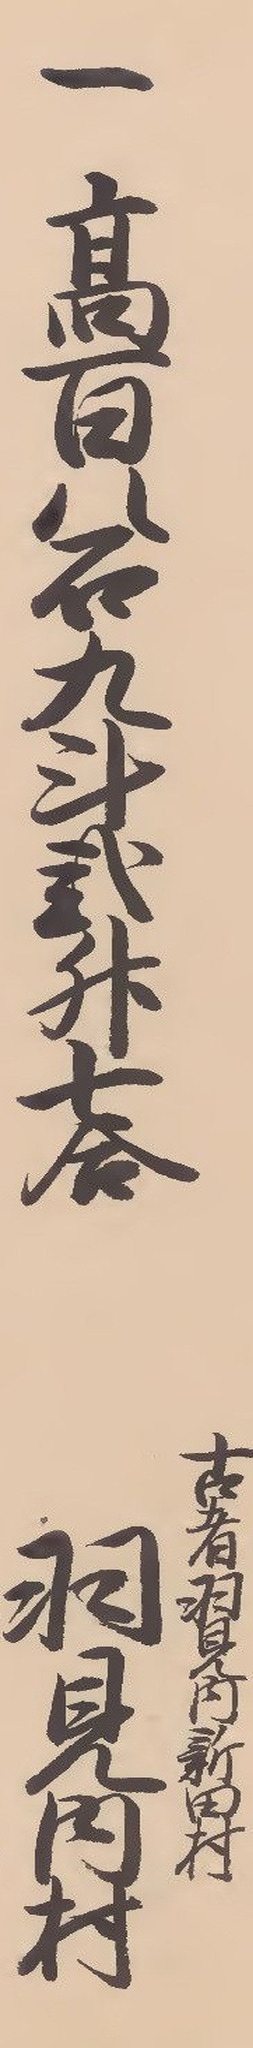一高百八石九斗弐升七合羽見内村
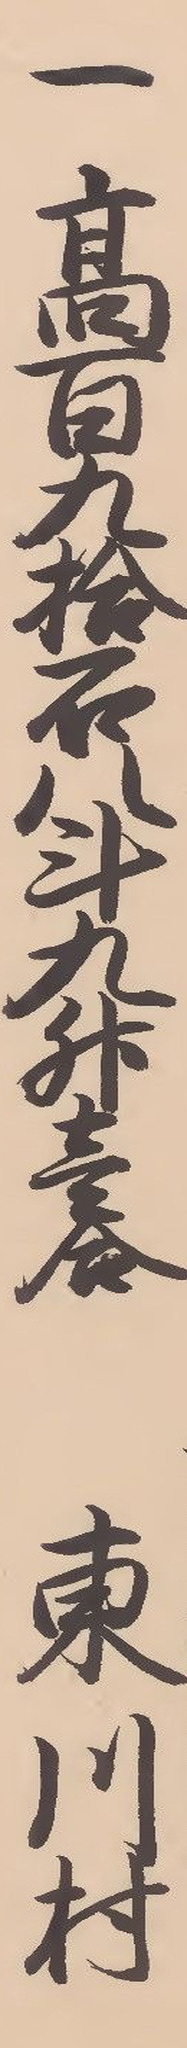一高百九拾石八斗九升壱合東川村
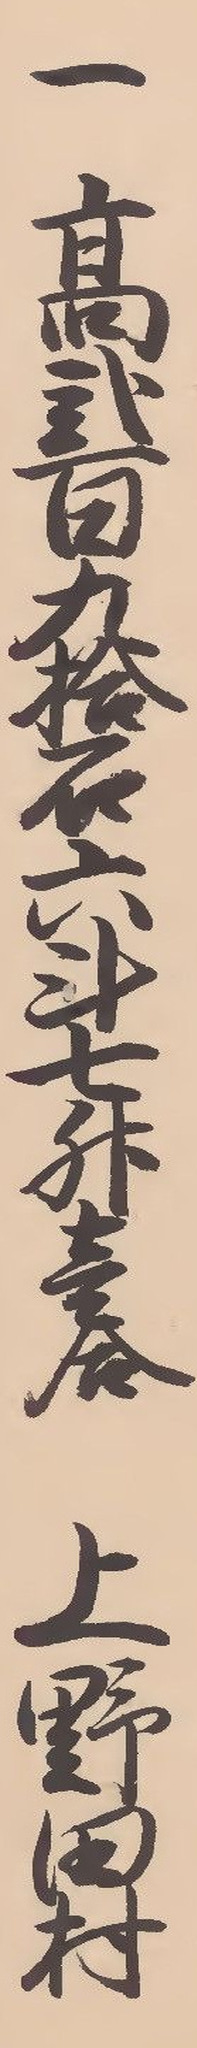一高弐百九拾石六斗七升壱合上野田村
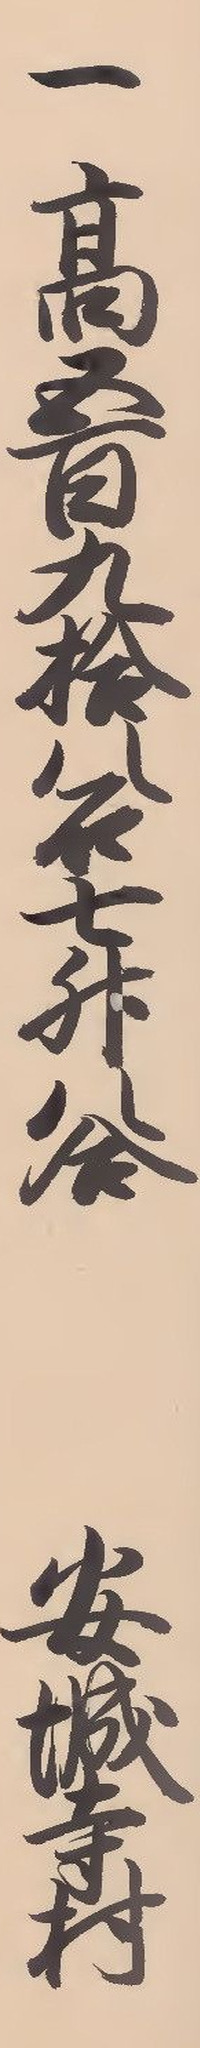一高五百九拾八石七升八合安城寺村
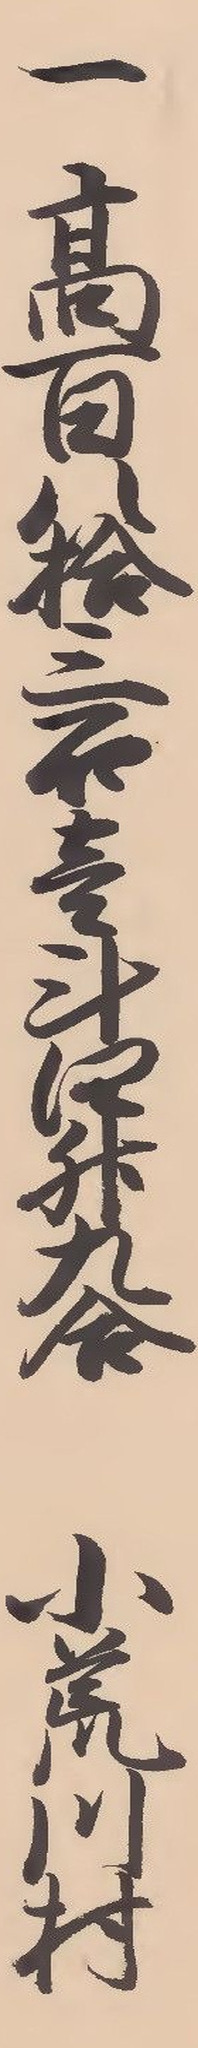一高百八拾三石壱斗四升九合小荒川村
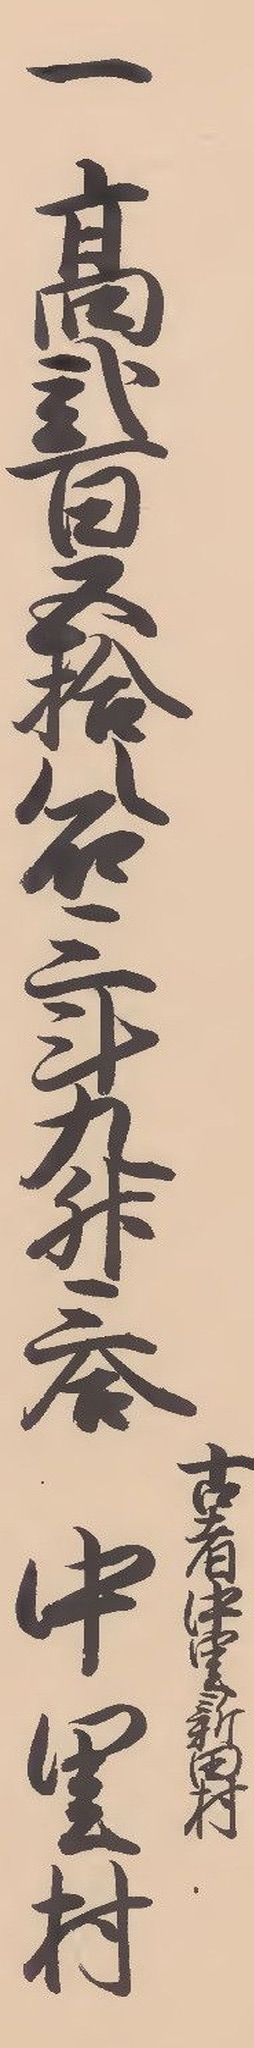一高弐百五拾八石三斗九升三合中里村
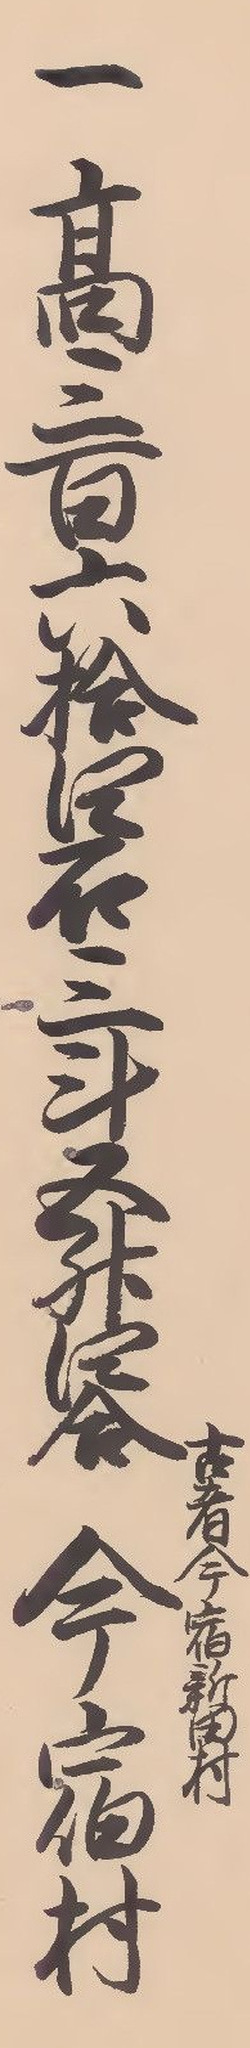一高三百六拾四石三斗五升四合今宿村

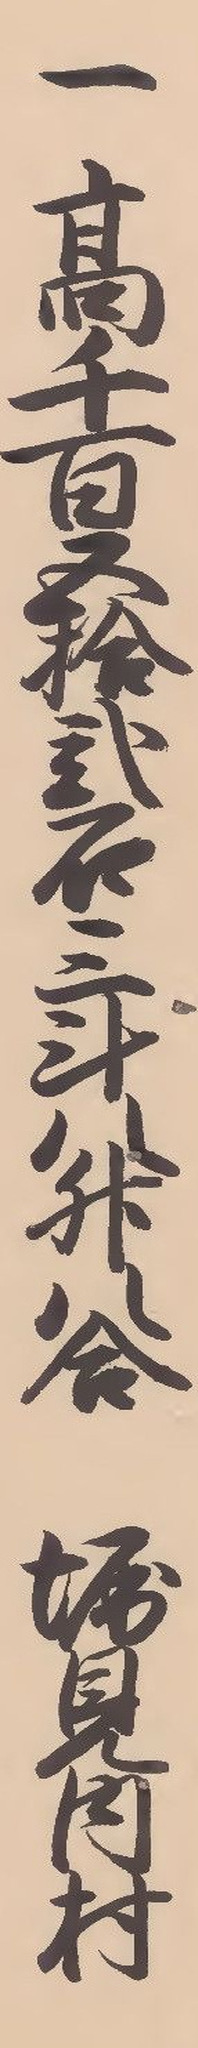一高千百五拾弐石三斗八升八合堀見内村
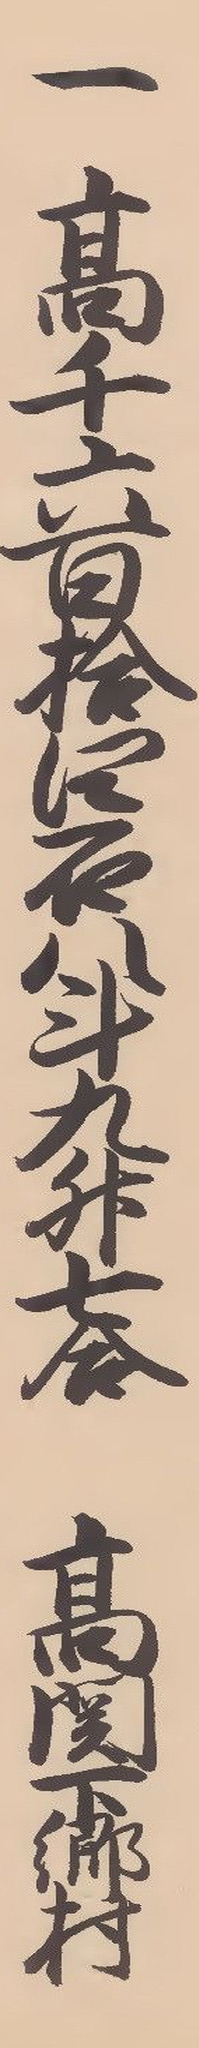一高千六百拾四石八斗九升七合高関下郷村
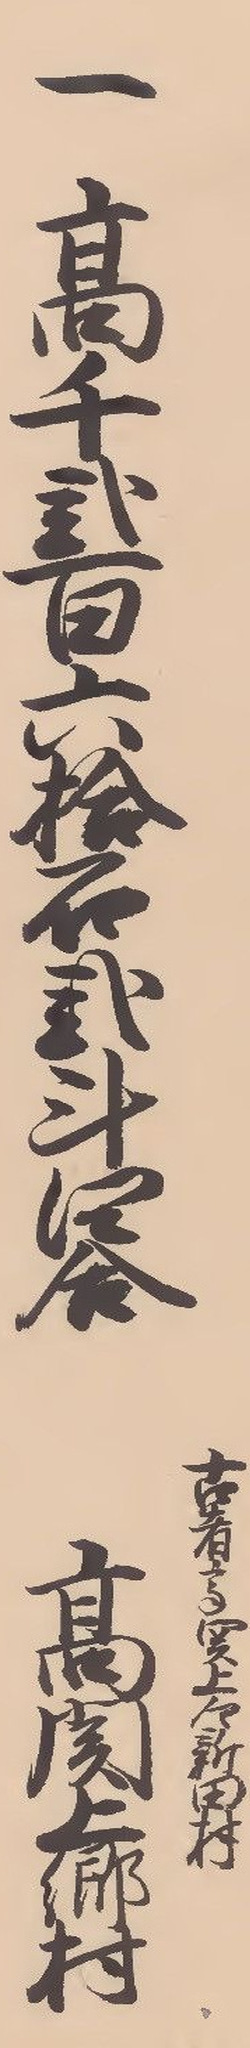一高千弐百六拾石弐斗四合高関上郷村
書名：出羽国郷帳　５
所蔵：国立公文書館 National Archives of Japan
